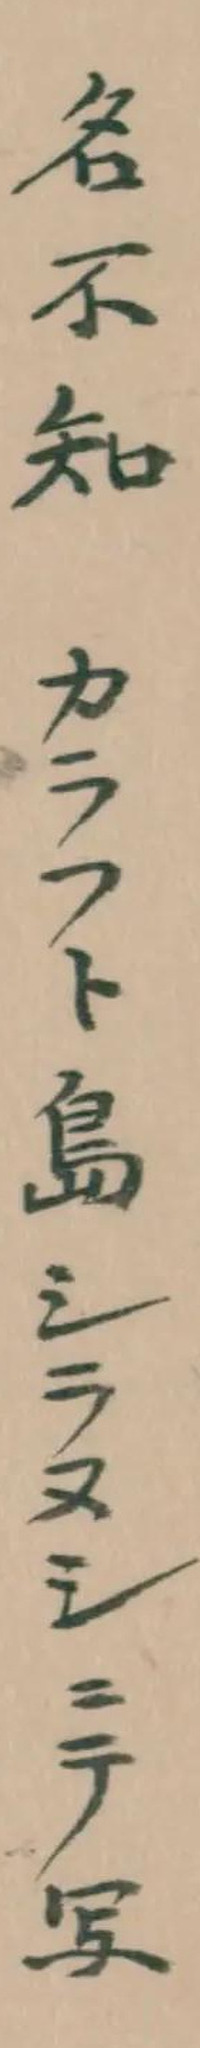名不知カラフト島シラヌシニテ写
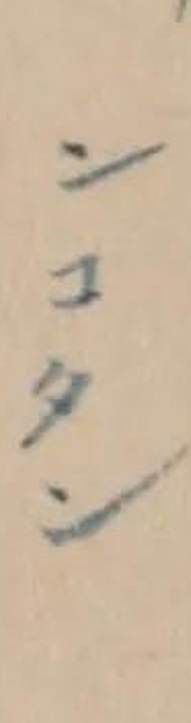ンコタン

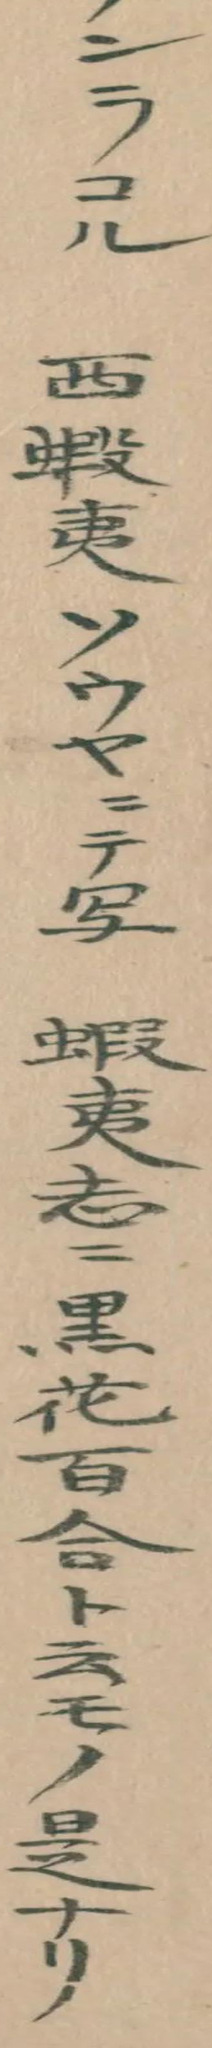アンラコル西蝦夷ソウヤニテ写蝦夷志ニ黒花百合ト云モノ是ナリ
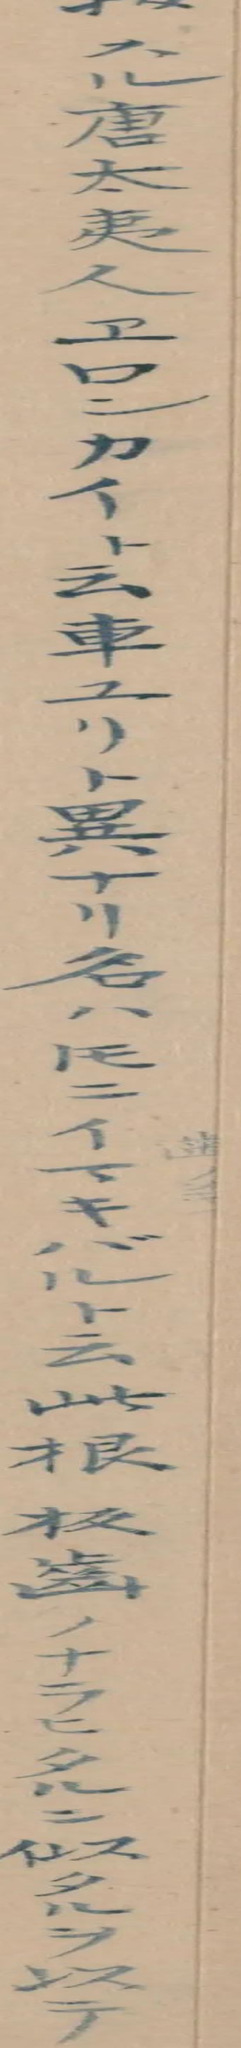按スル唐太夷人ヱロンカイト云車ユリト異ナリ名ハトモニイマキバルト云此根板歯ノナラヒタルニ似タルヲ以テ
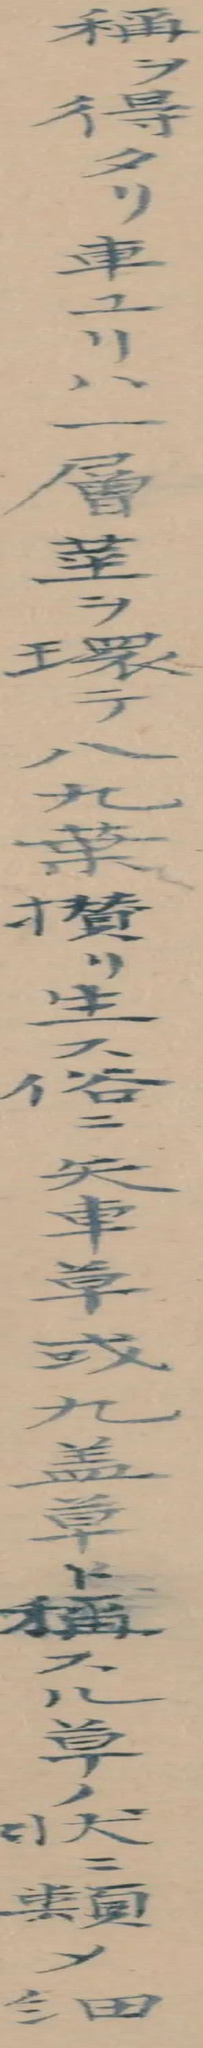称ヲ得タリ車ユリハ一層茎を環テ八九葉攅リ生ス俗ニ矢車草或九蓋草ト称スル草ノ状ニ類シテ細
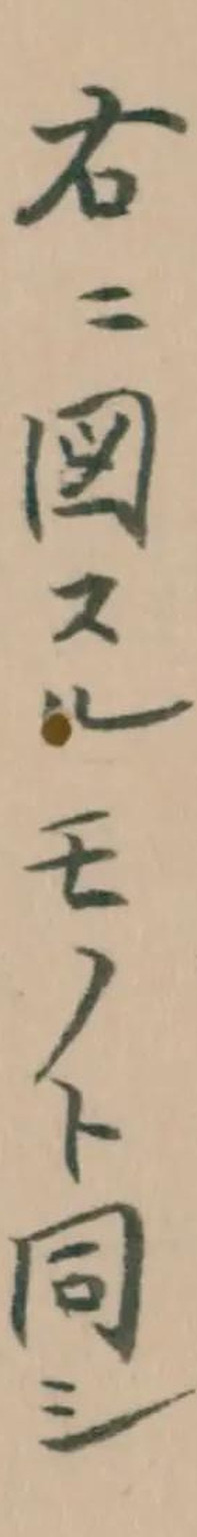右ニ図スルモノト同シ
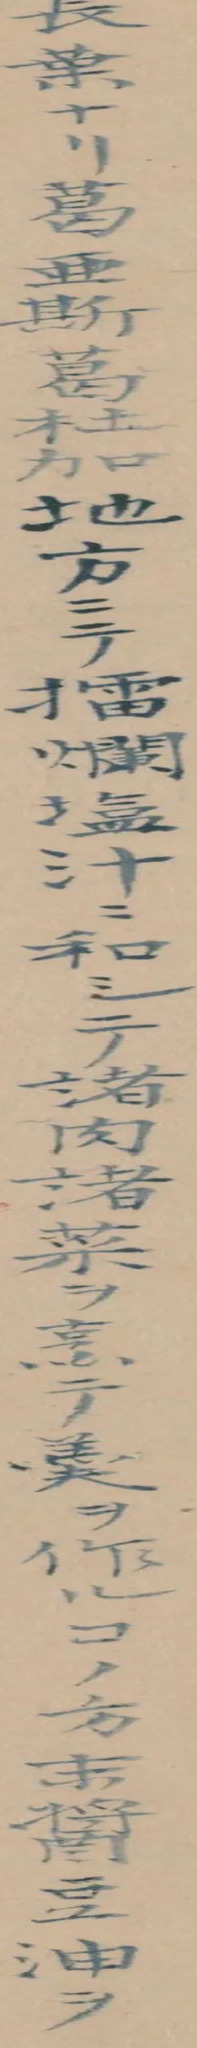長葉ナリ葛亜斯葛杜加地方ニテ擂爛塩汁ニ和シテ諸肉諸菜ヲ烹テ羹ヲ作ルコノ方末醤豆油ヲ
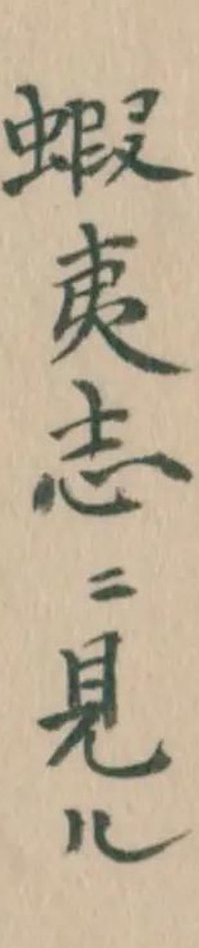蝦夷志ニ見ル
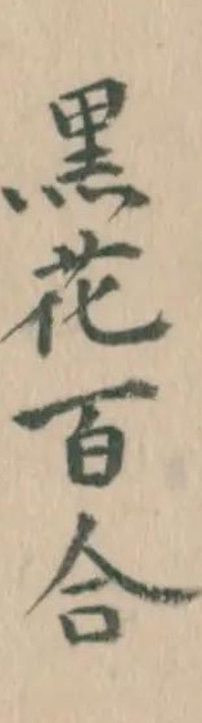黒花百合

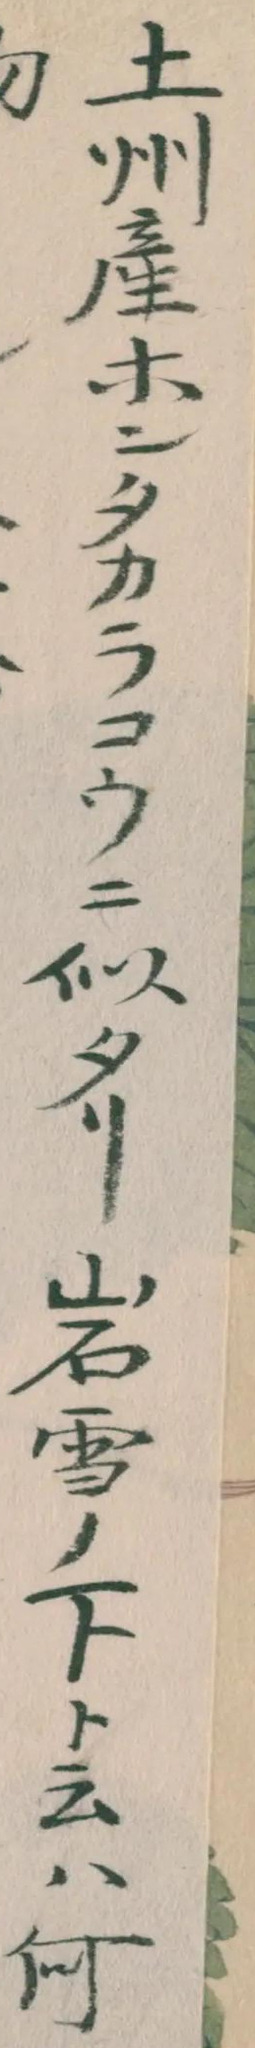土州産ホンタカラコウニ似タリ岩雪ノ下ト云ハ何
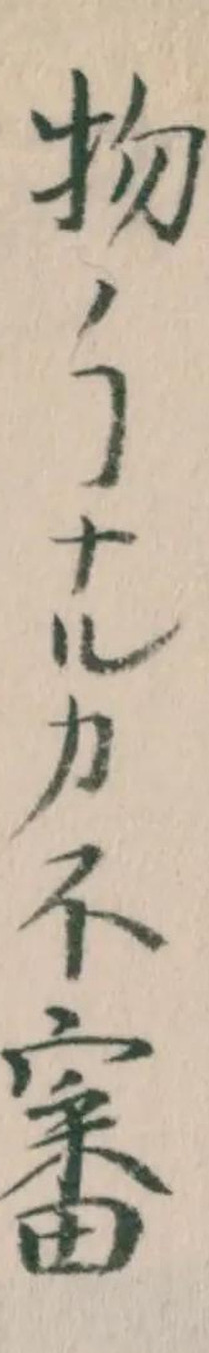物ノコトナルカ不審
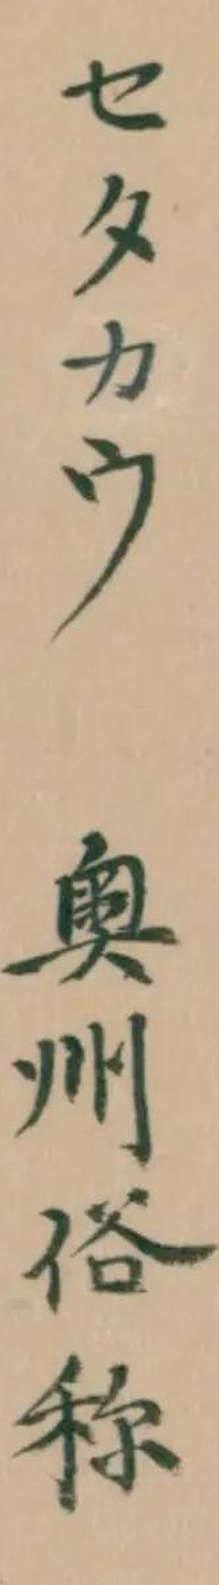セタカウ奥州俗称
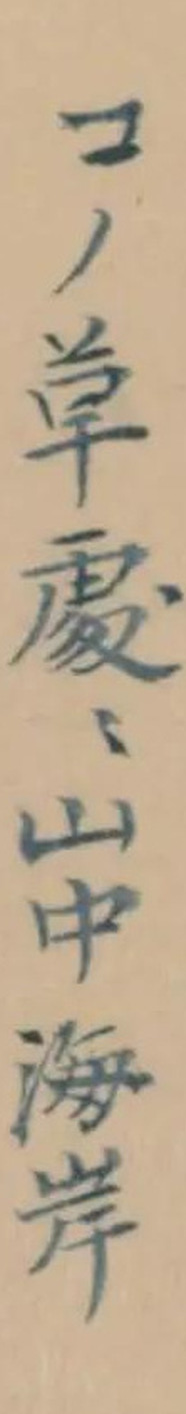コノ草処々山中海岸
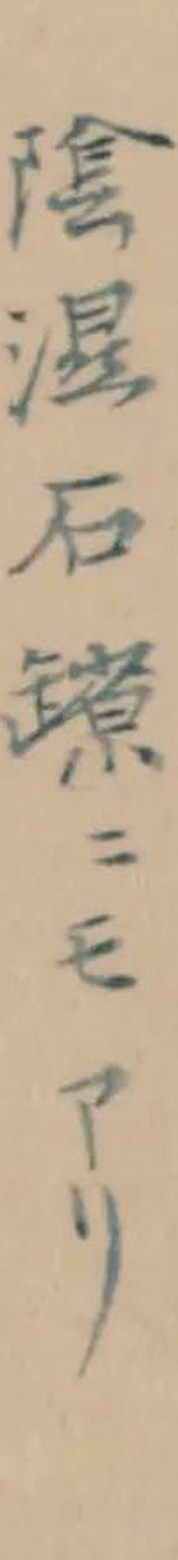陰湿石ニモアリ
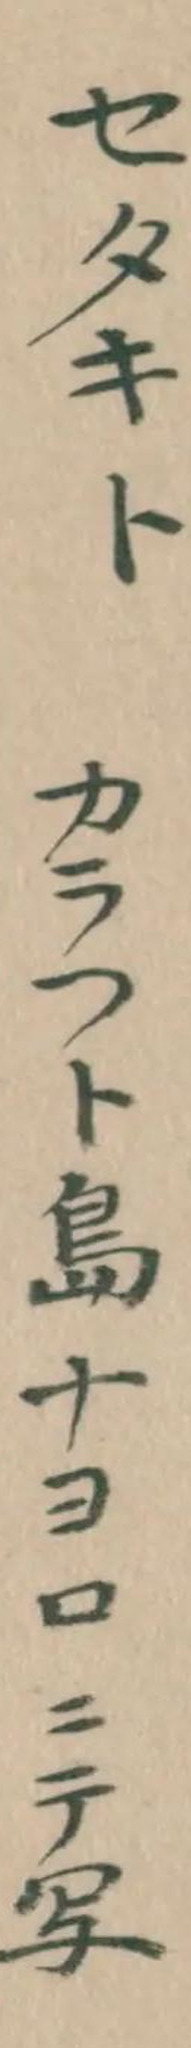セタキトカラフト島ナヨロニテ写
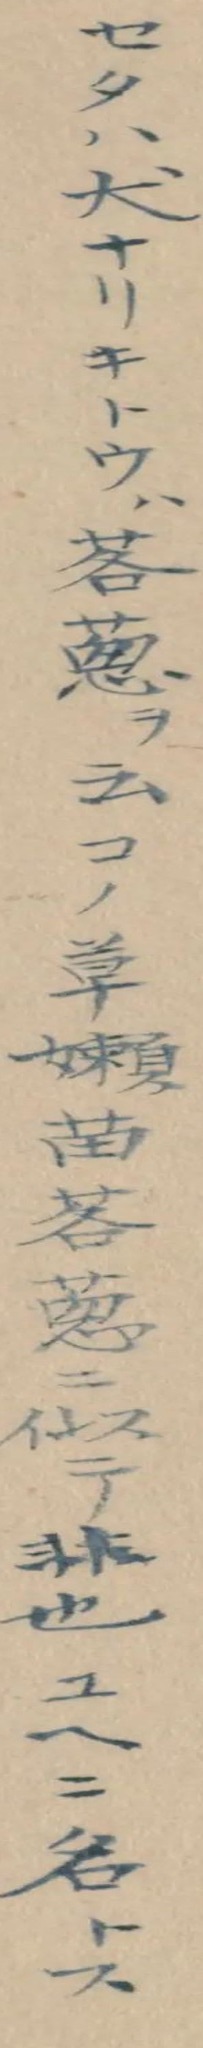セタハ犬ナリキトウハ茖葱ヲ云コノ草嬾苗茖葱ニ似テ非也ユヘニ名トス
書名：蝦夷草木図
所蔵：国立国会図書館 National Diet Library, JAPAN
